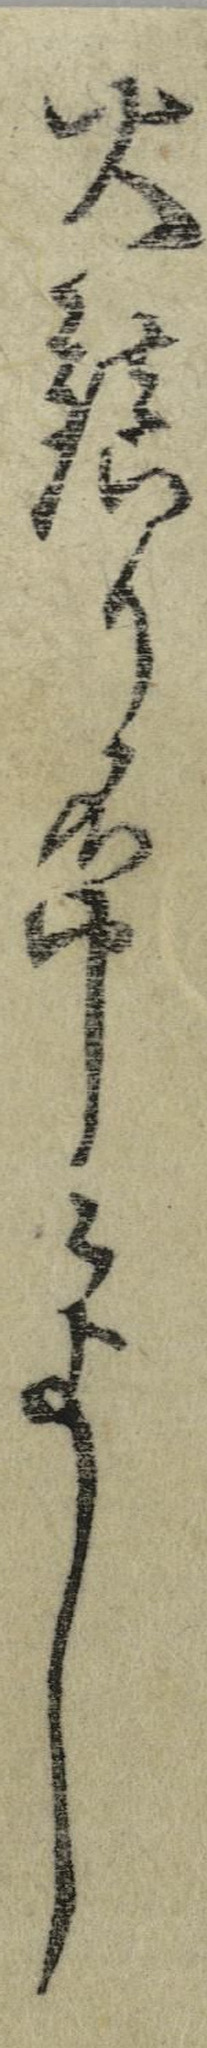火鎮り不申候よし
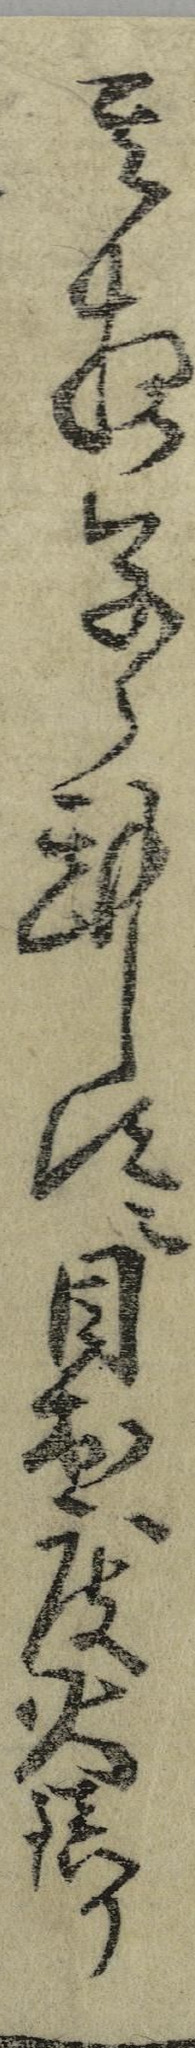其夜子ノ刻頃に目出度火鎮り申候
